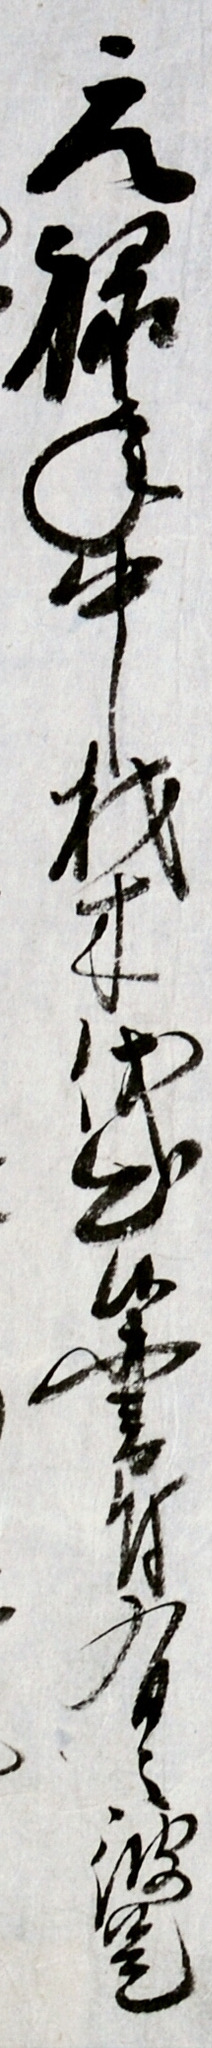元禄年中材木伐出候書付有之彼是
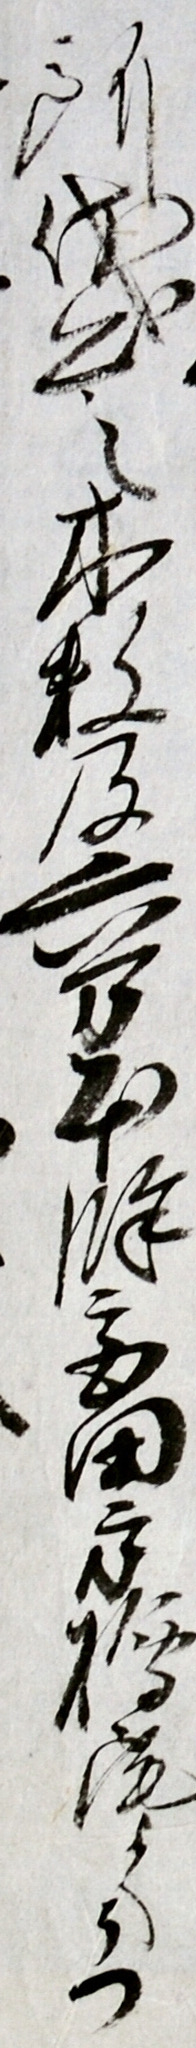所伐出し木数及六万本余宮田定檜尾よりうつ
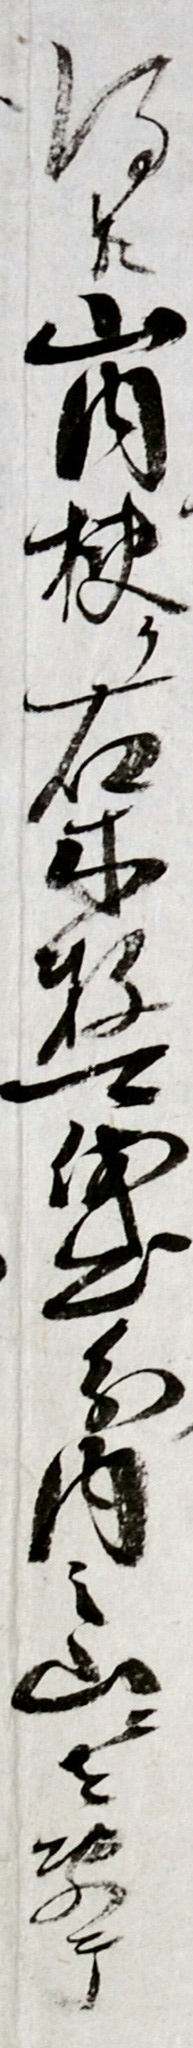得共山内挟り右木数可伐出分内之山ニ者決テ
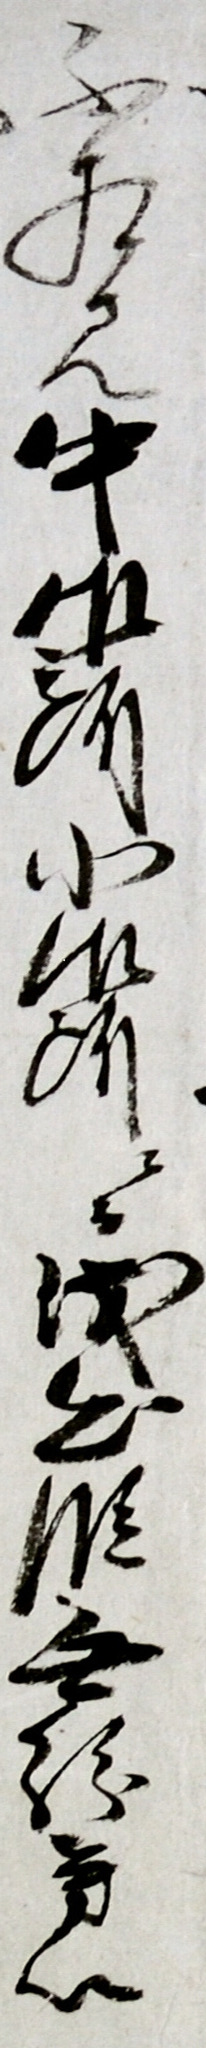不相見中御所北御所二而伐出段無紛旁以
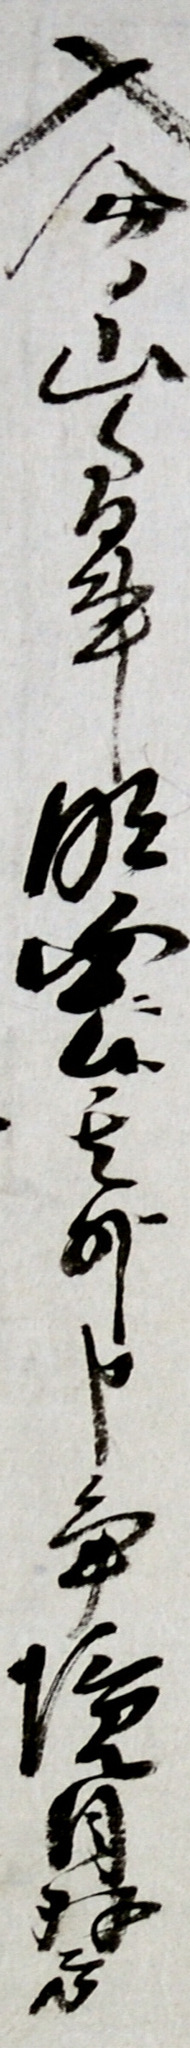入会山たる事明白二候其外申争境目双方
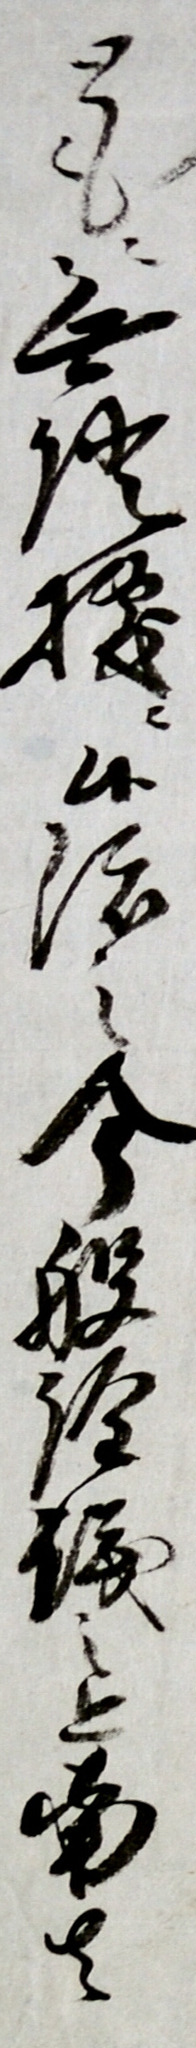ともに無證拠二候依之今般詮議之上南者
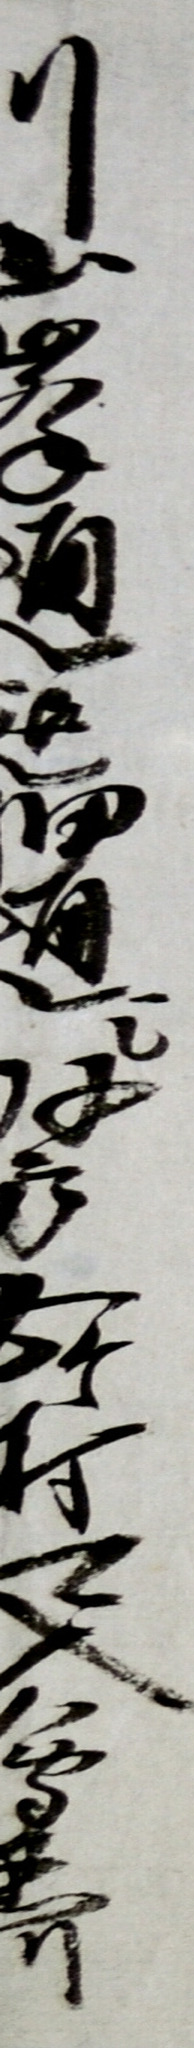川山峯通進押通し双方五ヶ村可入会黒川

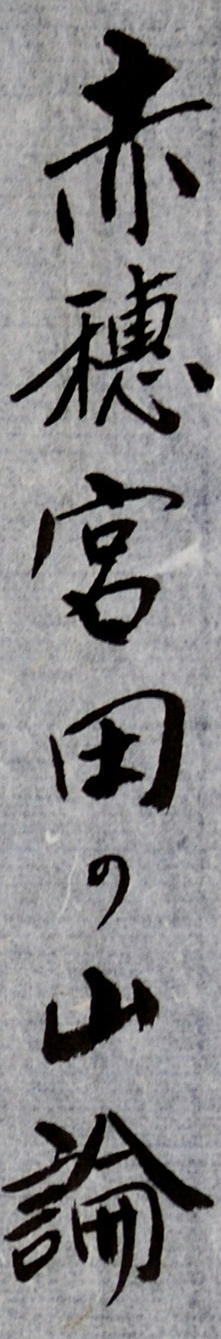赤穂宮田の山論
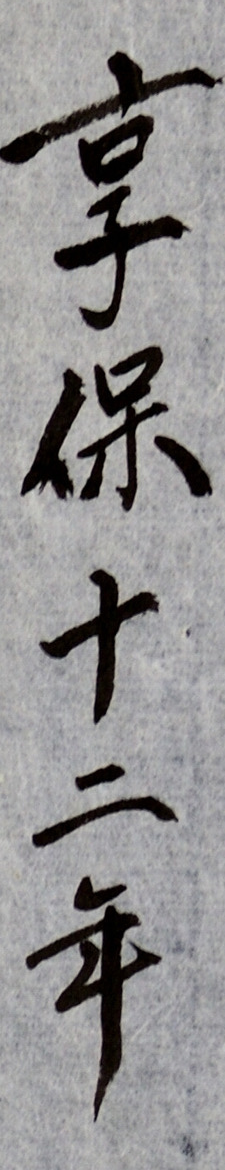享保十二年
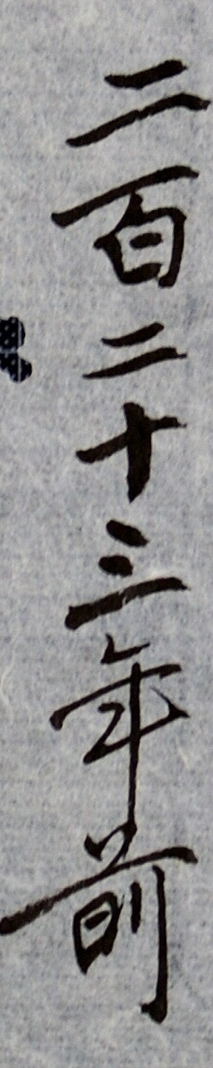二百二十三年前
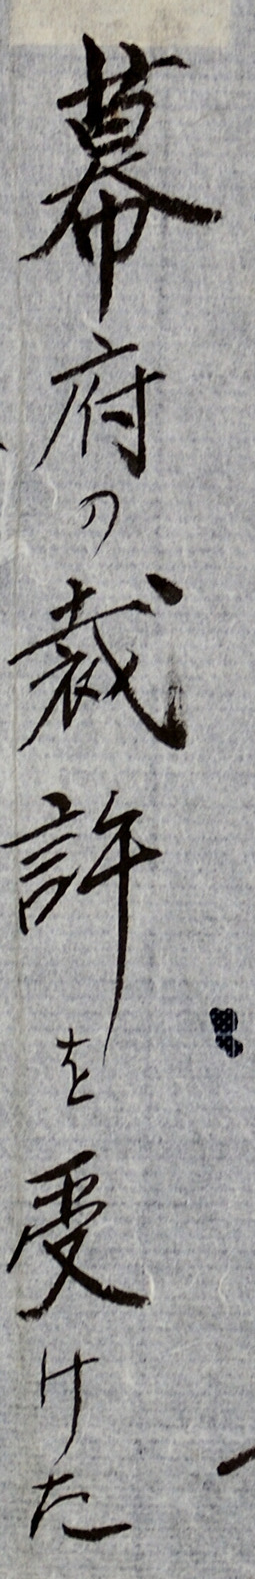幕府の裁許を受けた
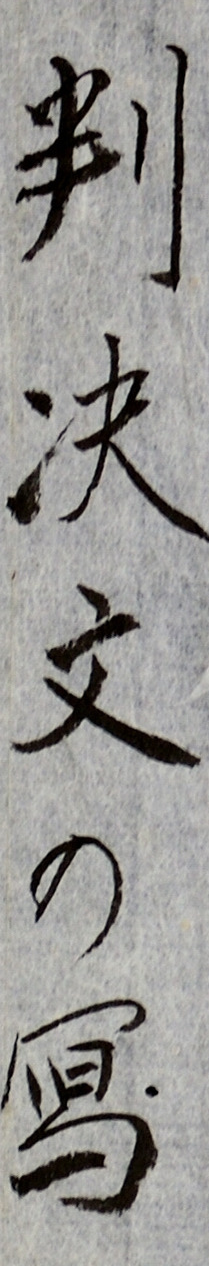判決文の写
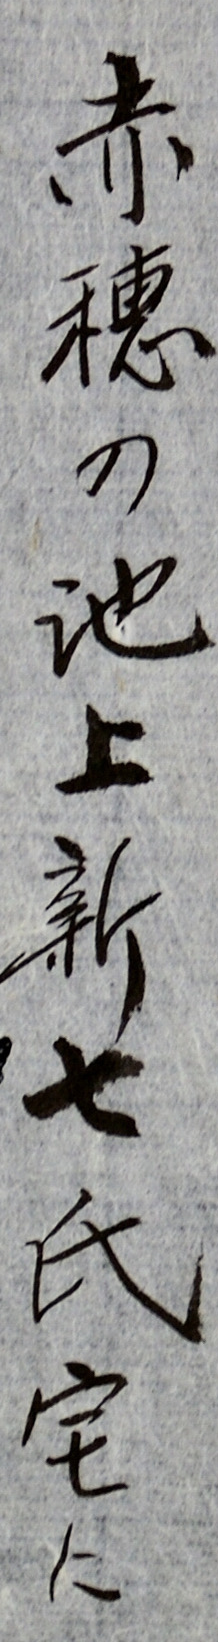赤穂の池上新七氏宅に
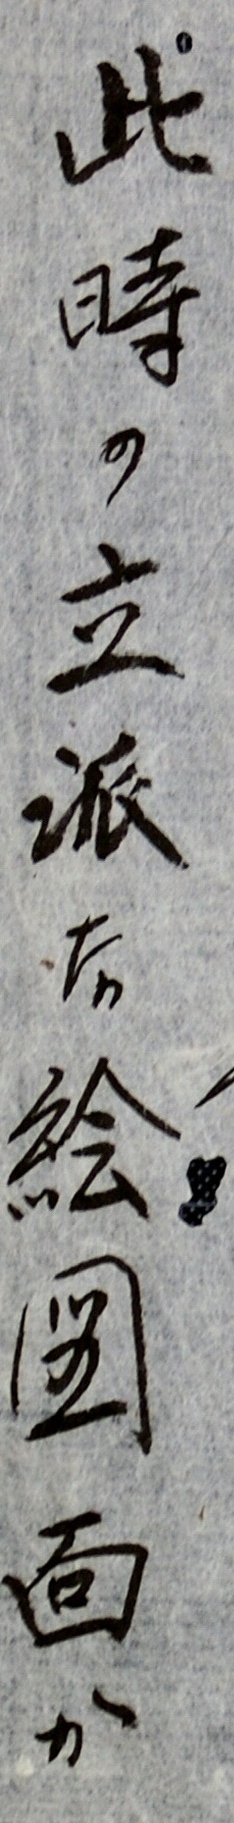此時立派な絵図面が
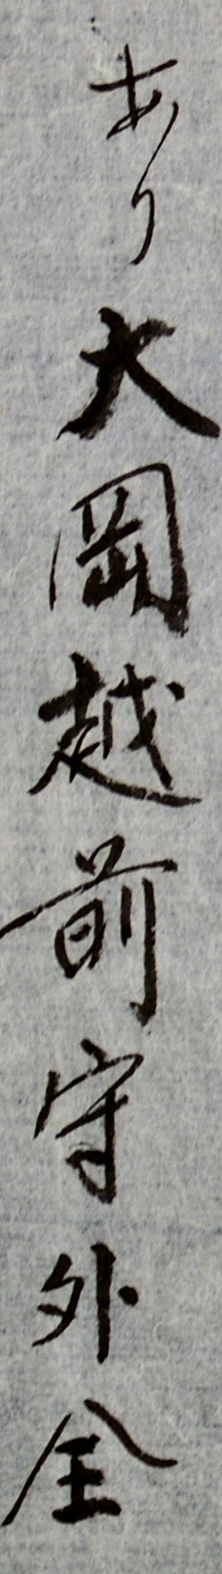あり大岡越前守外全
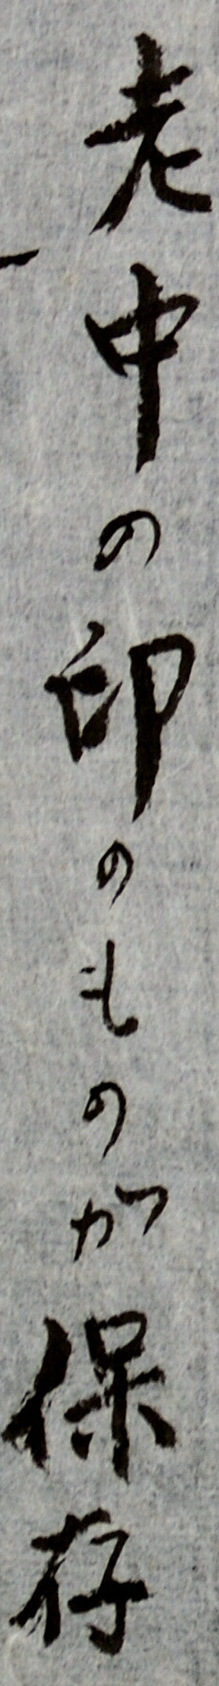老中の印のものが保存
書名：赤穂宮田山論裁許状
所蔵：伊那市立高遠町図書館・合同会社AMANE
